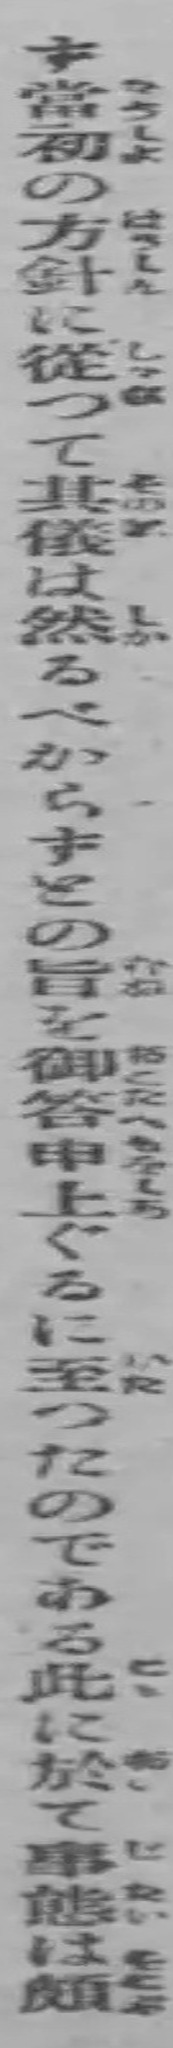ず当初の方針に従つて其儀は然るべからずとの旨を御答申上ぐるに至つたのである此に於て事態は頗
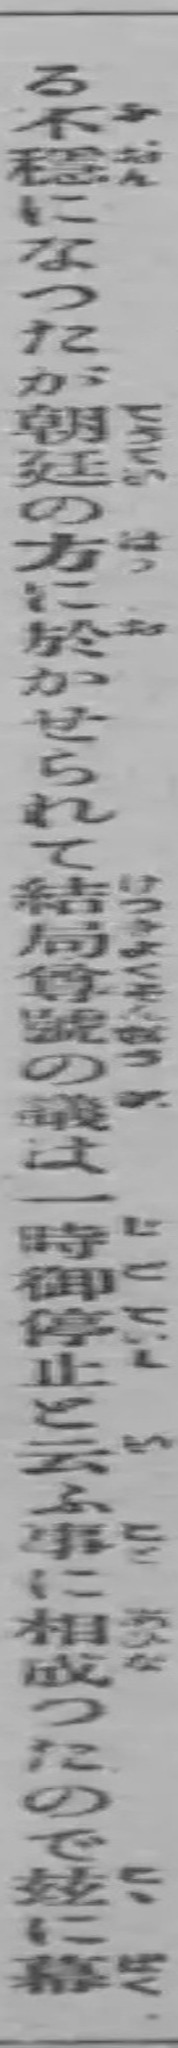事件の落着る不穏なつたが朝廷の方に於かせられて結局尊号の議は一時御停止と云ふ事に相成つたので茲に幕
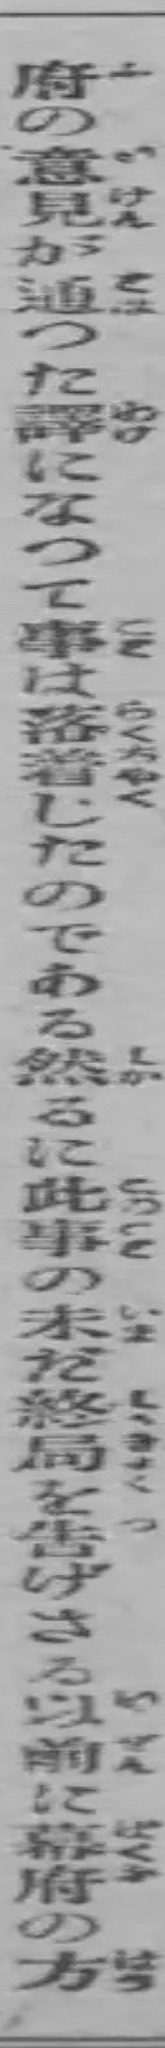府の意見が通つた訳になつて事は落着したのである然るに此事の未だ終局を告げさる以前に幕府の方
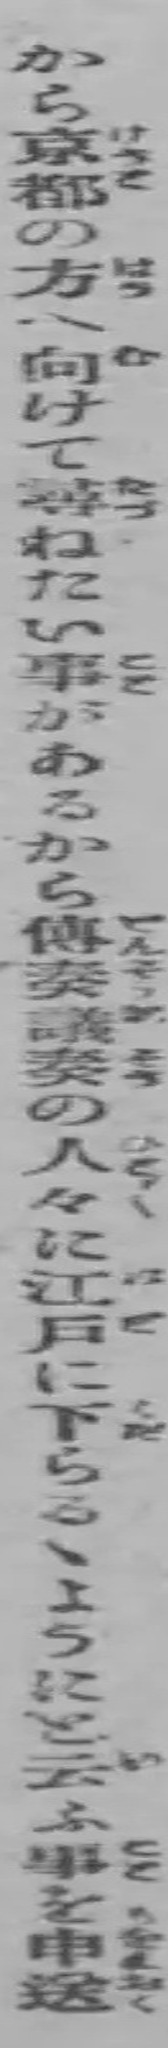から京都の方へ向けて尋ねたい事があるから伝奏議奏の人々に江戸に下らるゝようにと云ふ事を申送
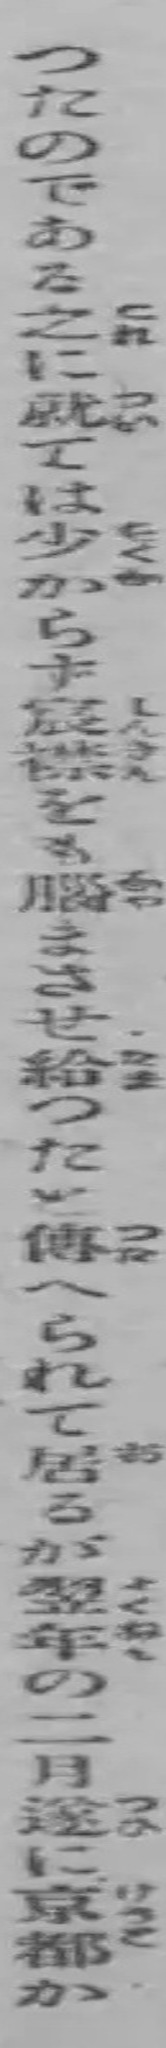つたのである之に就ては少からず宸襟をも脳まさせ給つたと伝へられて居るが翌年の二月遂に京都か
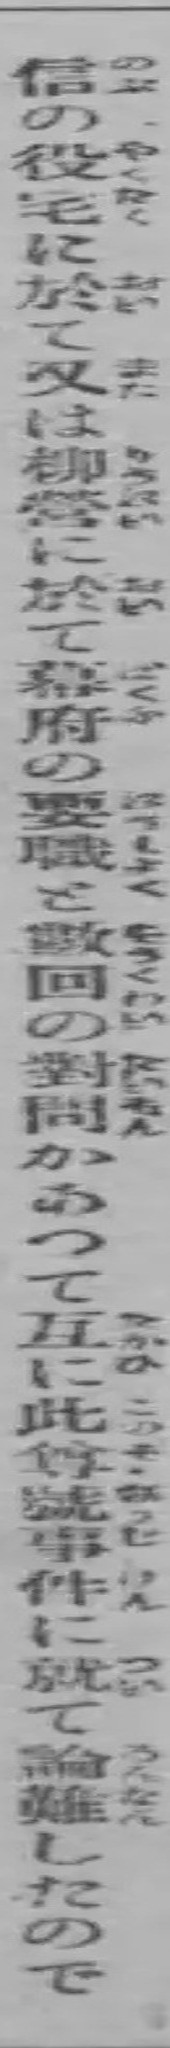信の役宅に於て又は柳営に於て幕府の要職と数回の対問かあつて互に此尊号事件に就て論難したので
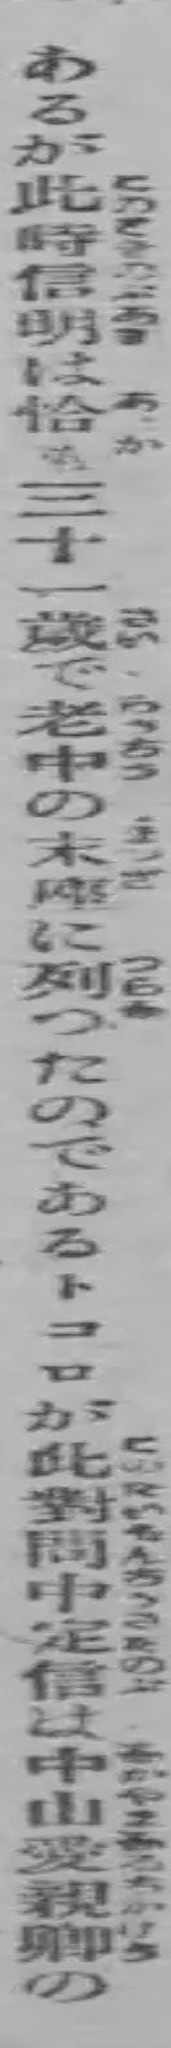信明の弁論あるが此時信明は恰も三十一歳で老中の末座に列つたのであるトコロが此対問中定信は中山愛親卿の
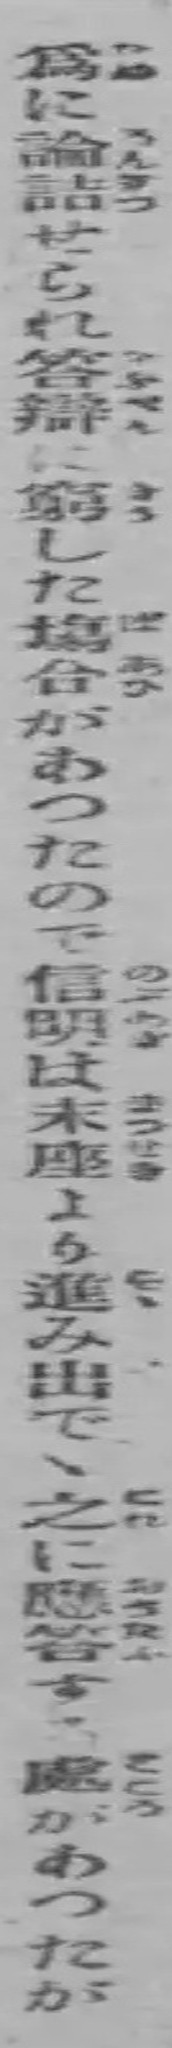為に論詰せられ答弁に窮した場合があつたので信明は末座より進み出でゝ之に応答する処があつたが
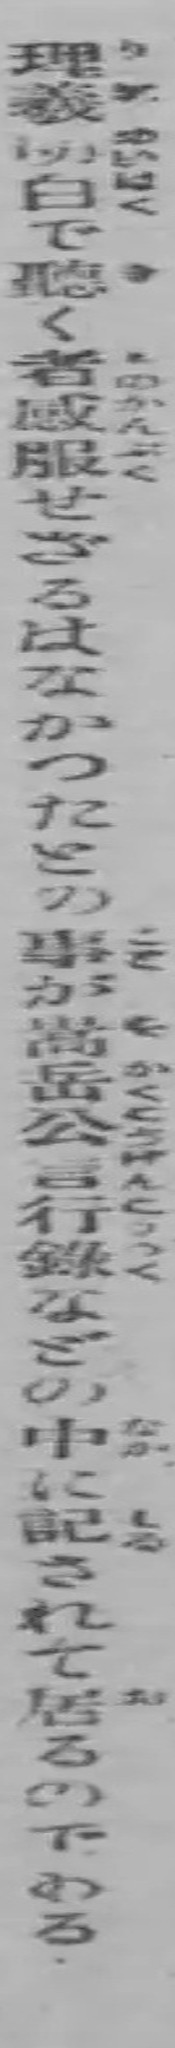理義明白で聴く者感服せざるはなかつたとの事が嵩岳公言行録などの中に記されて居るのである
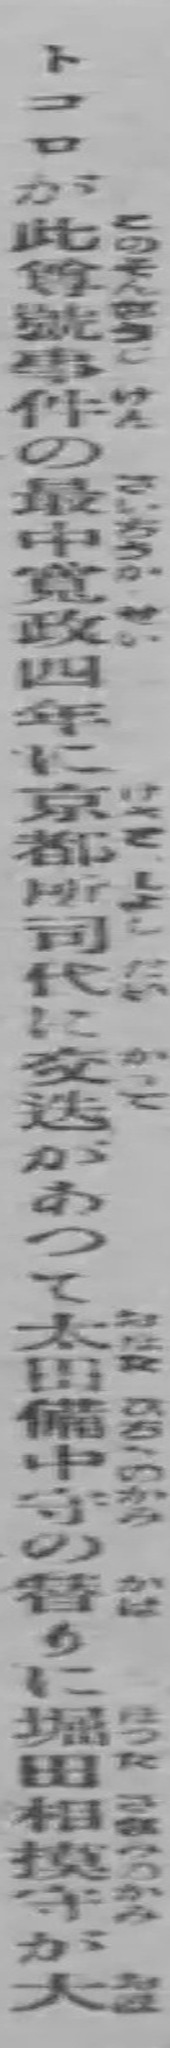トコロが此尊号事件の最中寛政四年に京都所司代に交迭があつて太田備中守の替りに堀田相模守が大
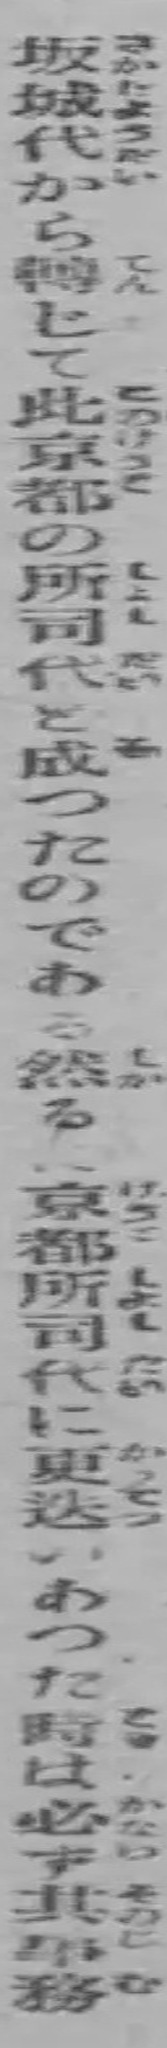坂城代から転じて此京都の所司代と成つたのである然るに京都所司代に更迭のあつた時は必ず其事務
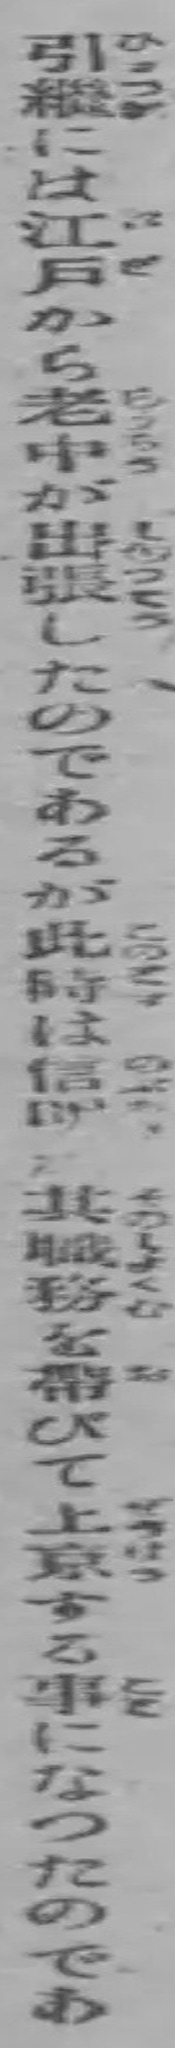信明の上京引継には江戸から老中が出張したのであるが此時は信明が其職務を帯びて上京する事になつたのであ

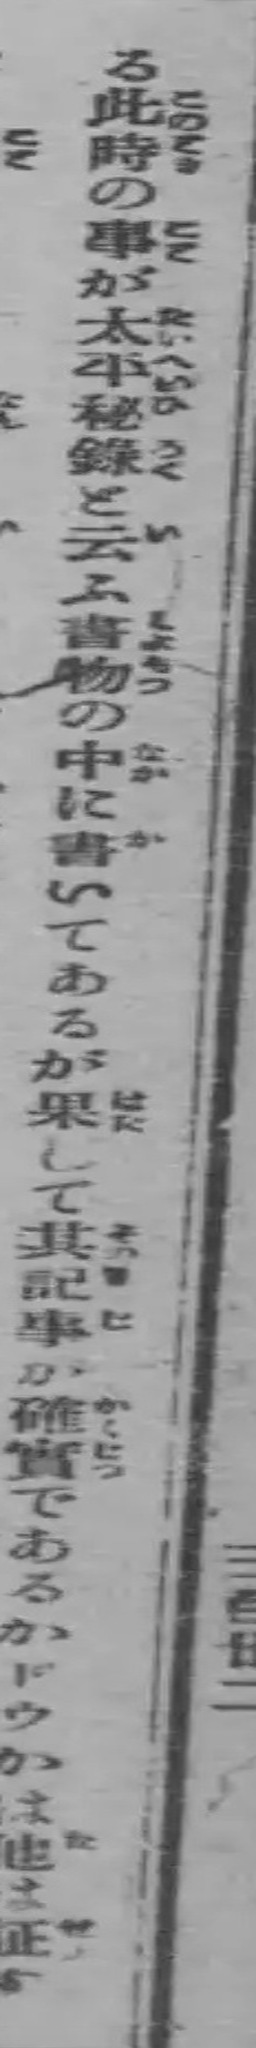る此時の事が太平秘録と云ふ書物の中に書いてあるが果して其記事が確実であるかドウかは他は証す
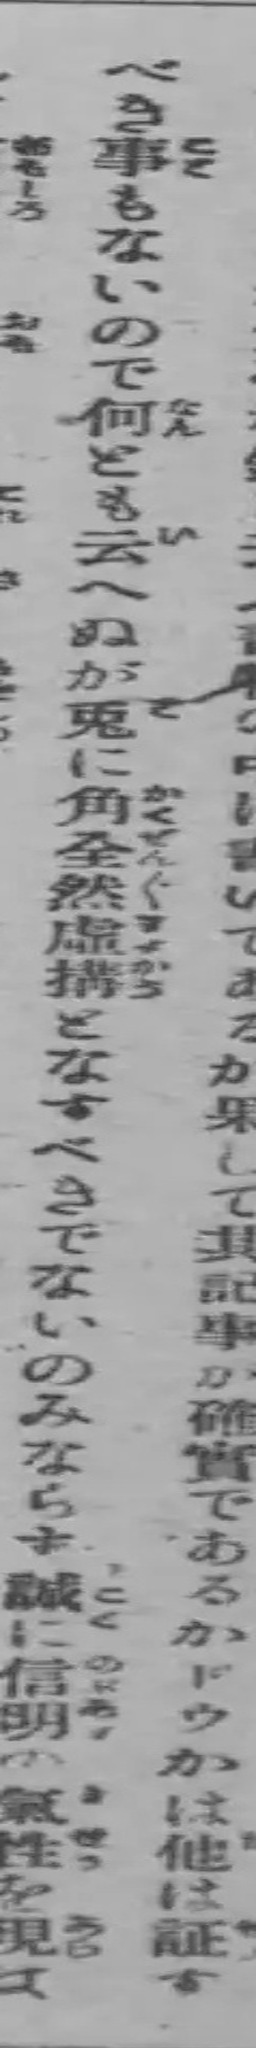べき事もないので何とも云へぬが兎に角全然虚構となすべきでないのみならず誠に信明の気性を現は
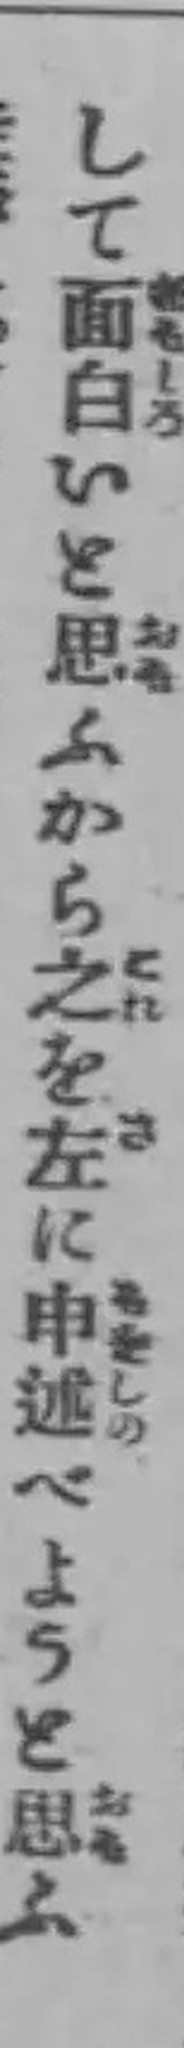して面白いと思ふから之を左に申述べようと思ふ
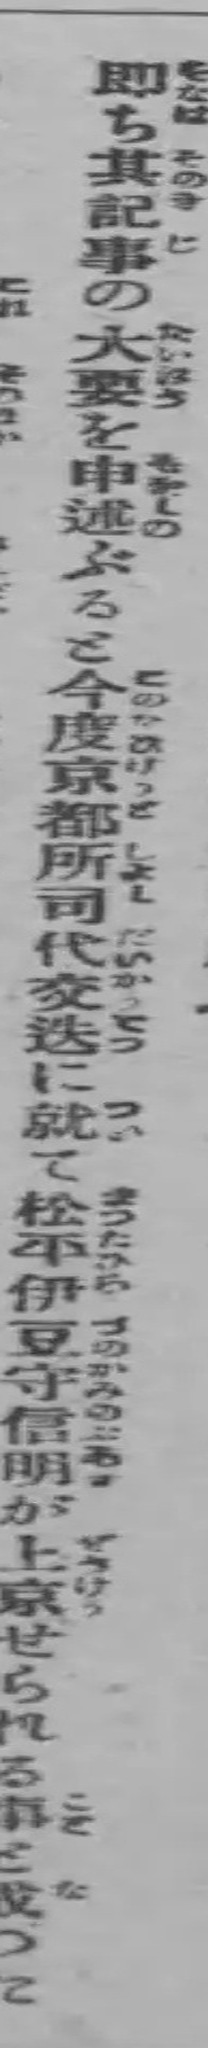即ち其記事の大要を申述ぶると今度京都所司代交迭に就て松平伊豆守信明が上京せられる事と成つた
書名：豊橋市史談
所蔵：国立国会図書館 National Diet Library, JAPAN
